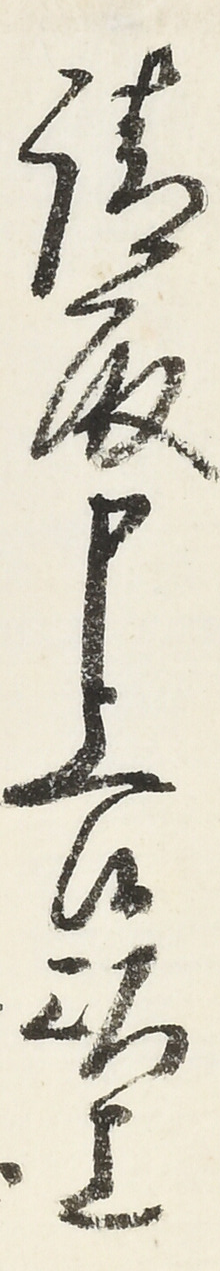請取申上候以上
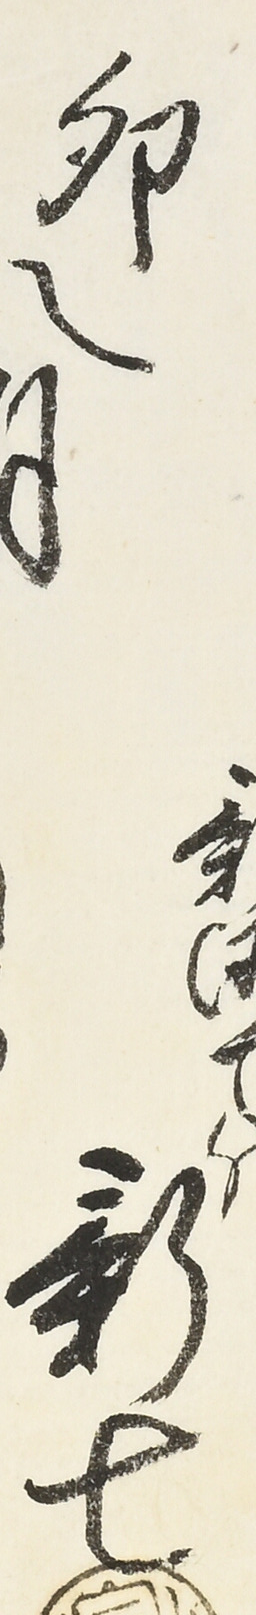卯八月同断
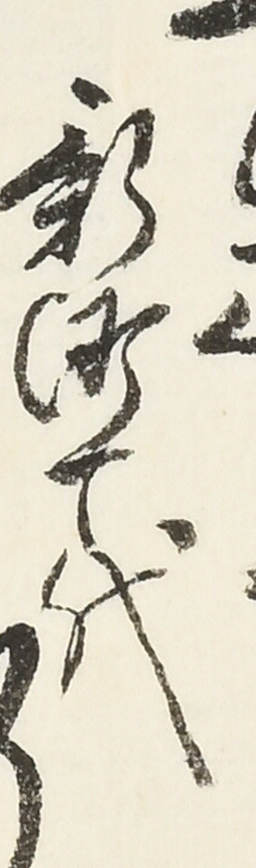新町丁代
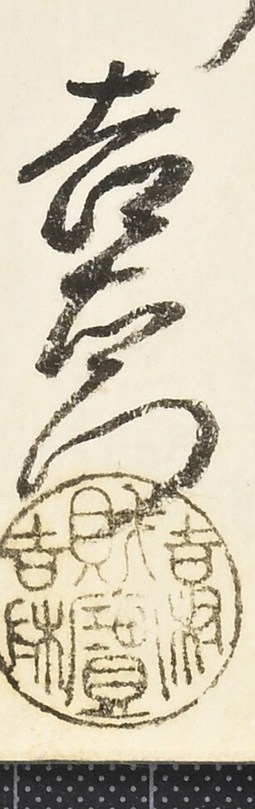吉右衛門
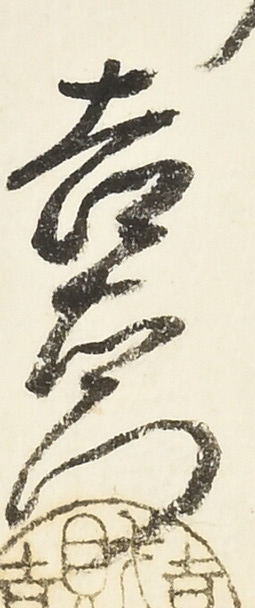吉右衛門
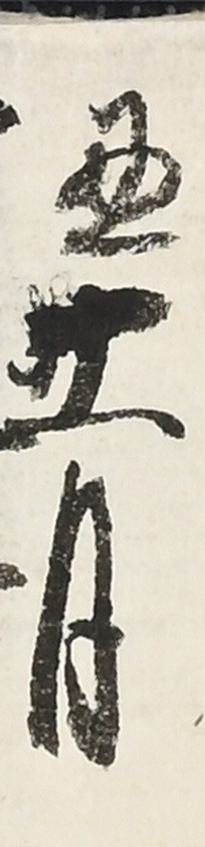丑十一月
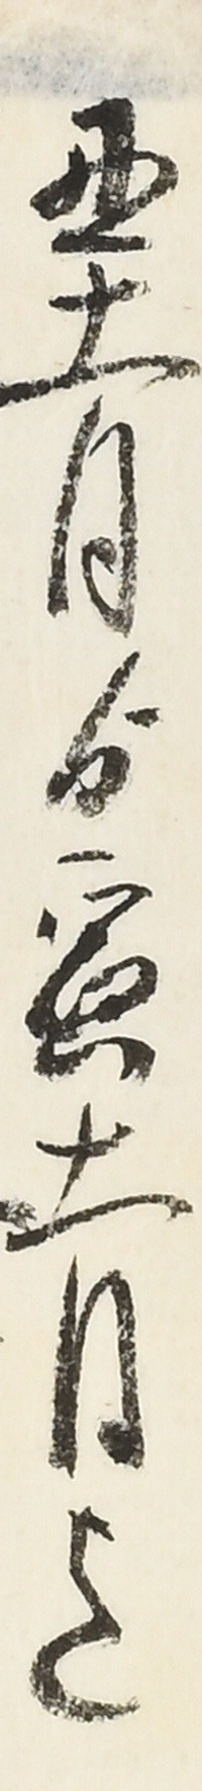丑十一月ゟ寅十一月迄
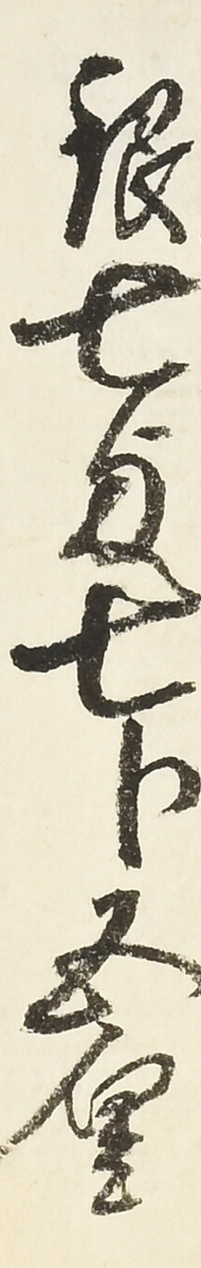銀七匁七分五厘
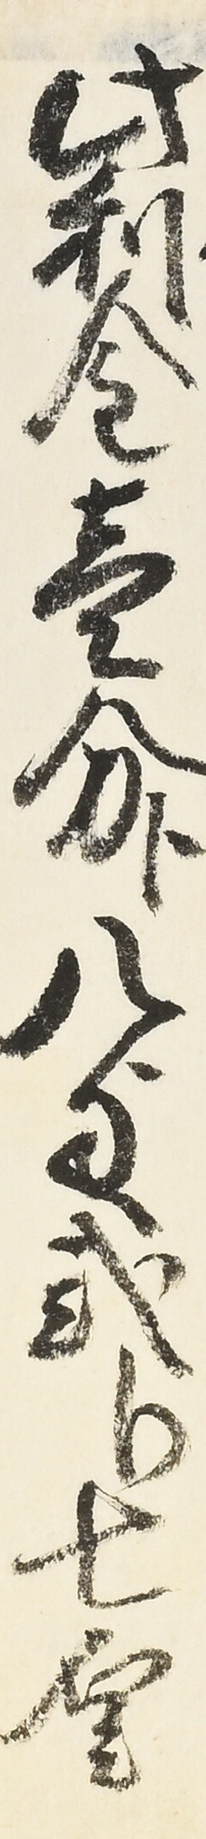此利金壱分ト八匁弐分七厘
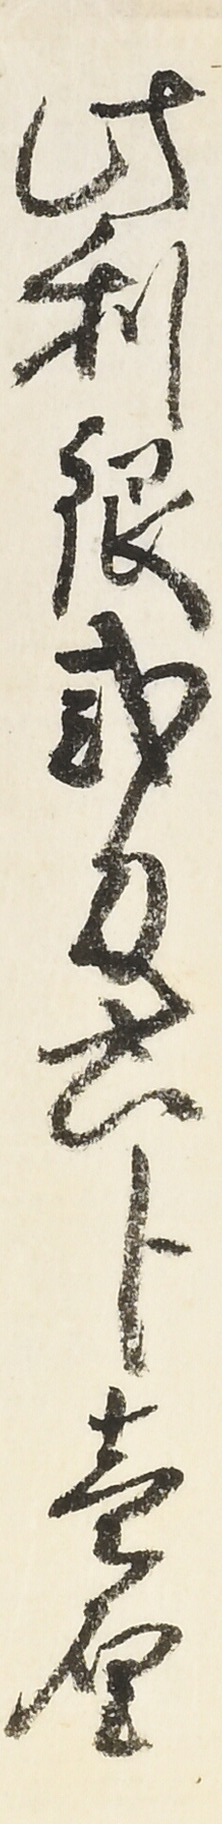此利銀弐匁六分壱厘
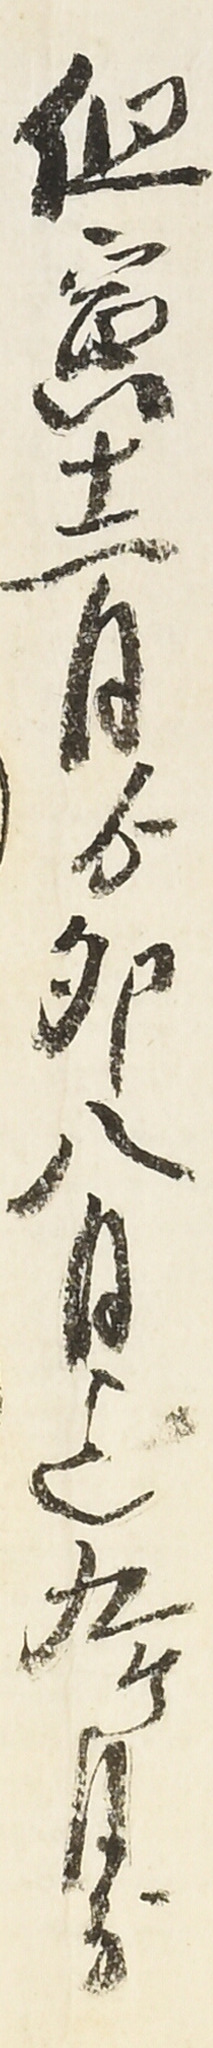但寅十二月ゟ卯八月迄九ヶ月分
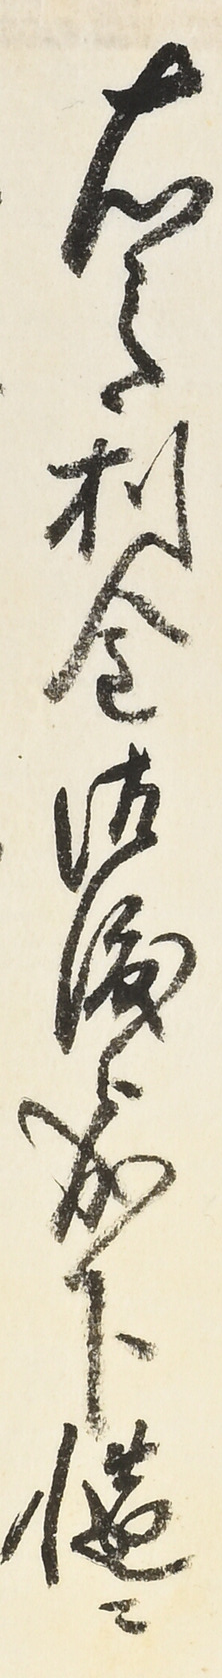右之利金御渡被成下慥ニ
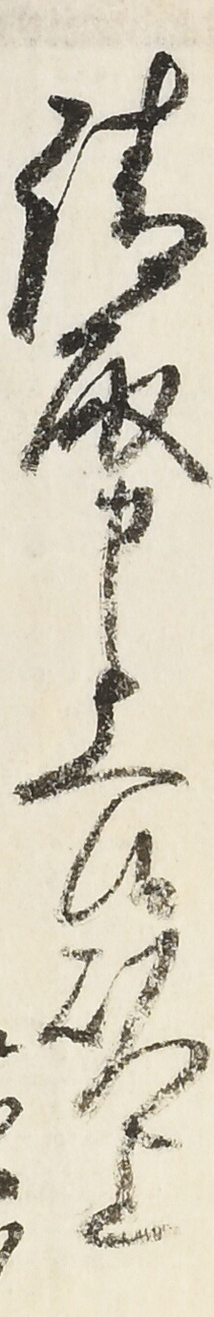請取申上候以上
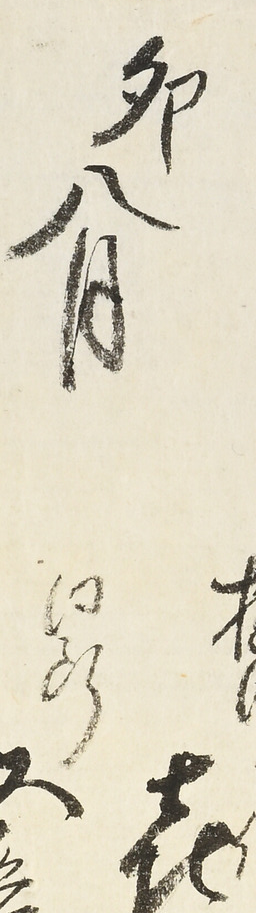卯八月同断
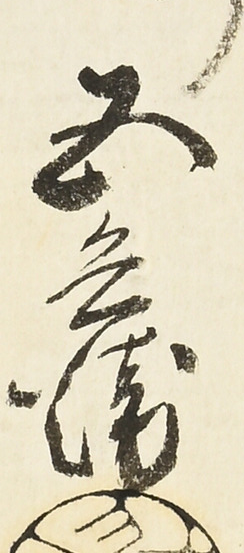五兵衛
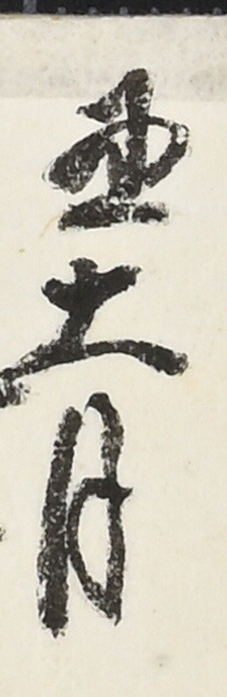丑十一月
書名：御才覚金御利足割渡扣帳
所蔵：伊那市立高遠町図書館・合同会社AMANE
